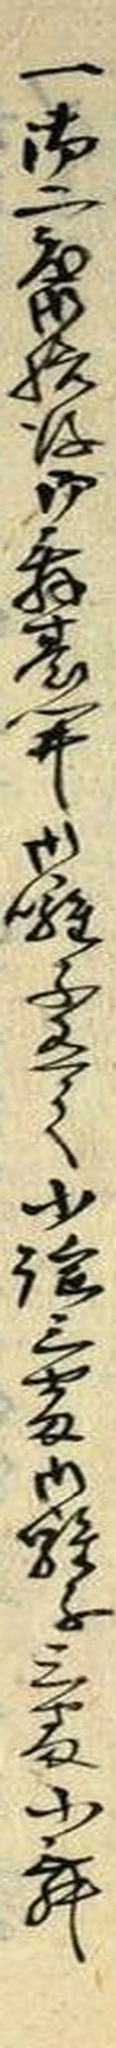一御二度御膳後御舞台開御囃子有之小謡三番御囃子三番小舞
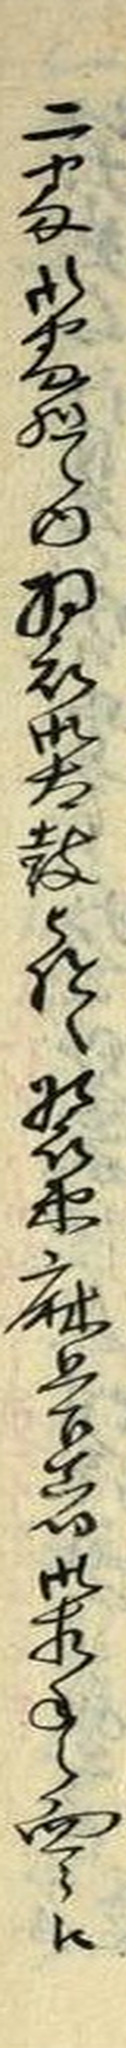二番御番組之内羽衣御太鼓被遊之装束麻上下着御相手之面々江
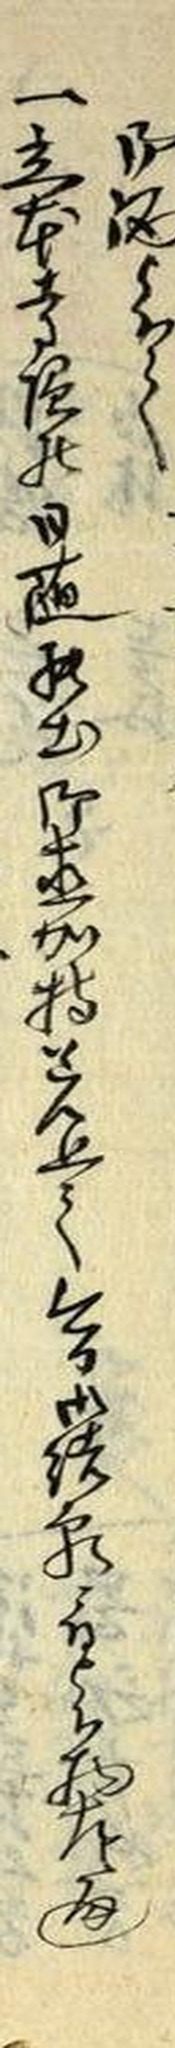一立本寺隠居日随罷出御直加持差上之今日御結願ニ付被下物左之通
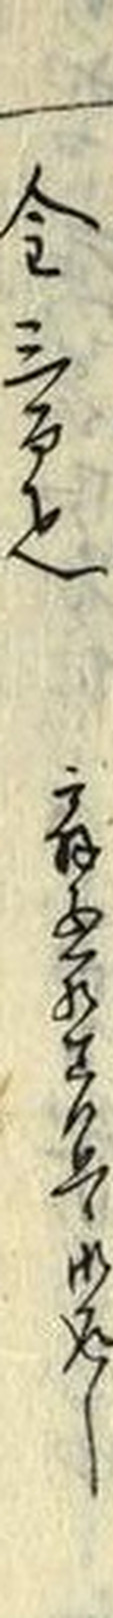金三百疋扇子箱差上候御返し
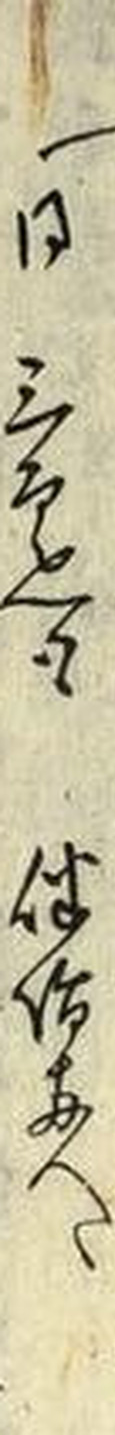同三百疋ツヽ伴僧両人へ
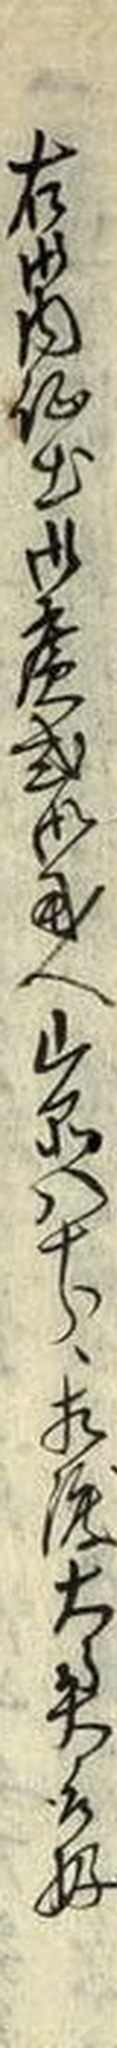右御内証出御広式御用人山品八十郎へ相渡大奥取扱
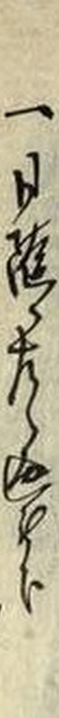一日随へ左之通被下
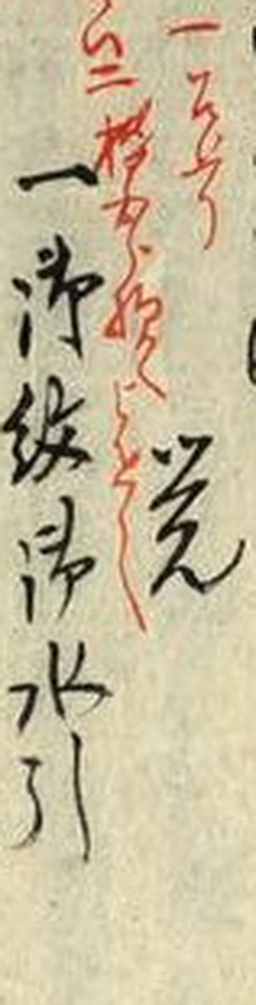一御紋御水引一
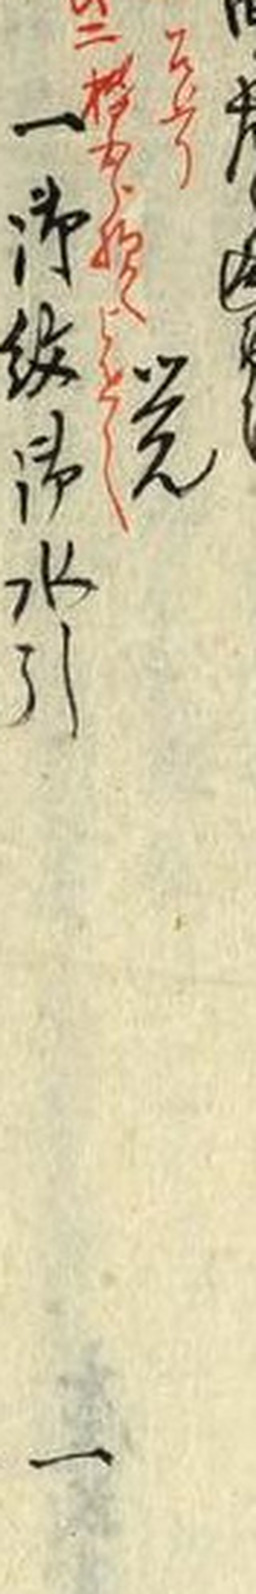一御紋御水引一
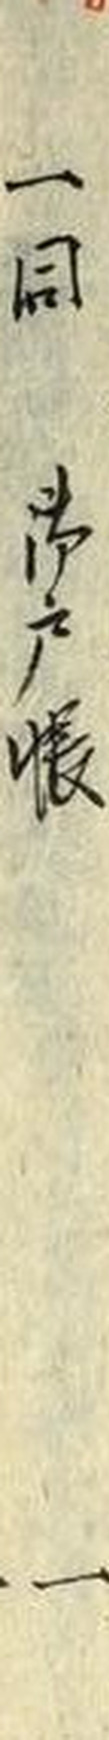一同御戸帳一
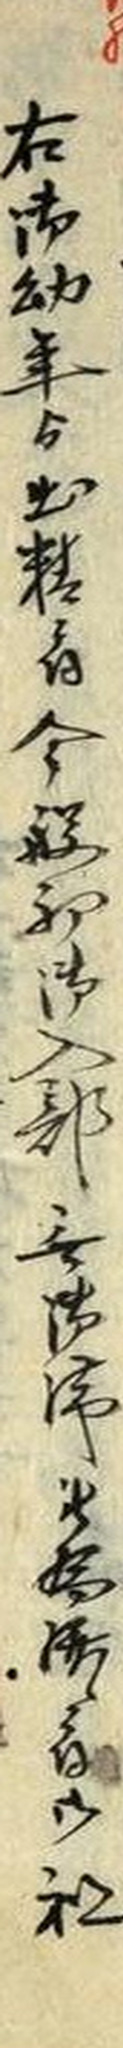右御幼年ゟ出精ニ付今般初御入部無御滞被為済候ニ付御祖
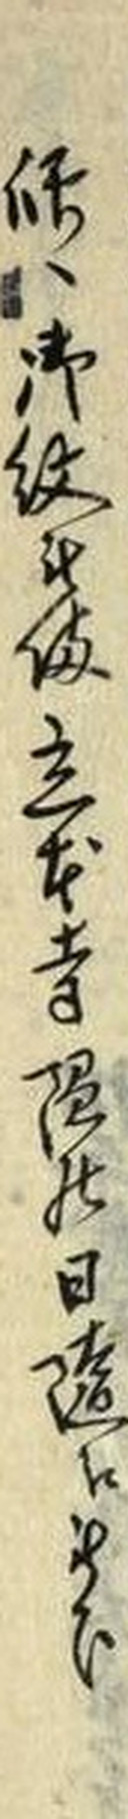師へ御紋被備立本寺隠居日随江被下

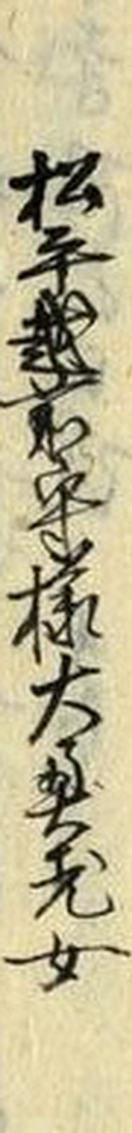松平越前守様大奥老女
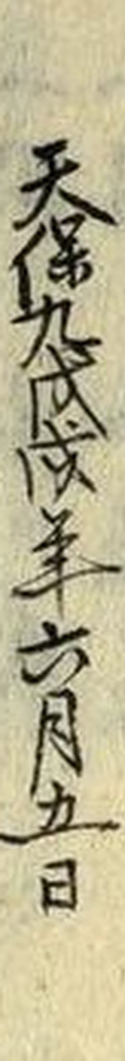天保九戊戌年六月五日藤田
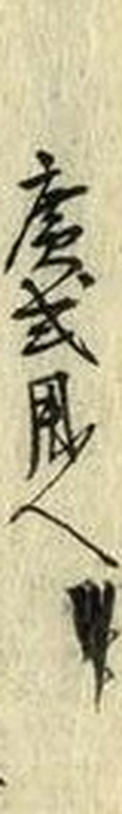広式用人
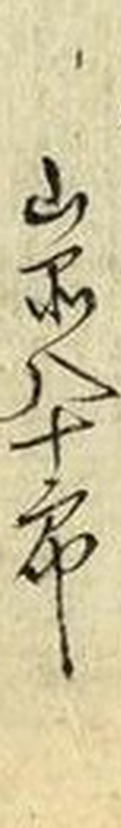山品八十郎
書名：少傅日録抄（斉善付側向頭取日記、江戸并道中、初入在国、逝去後…
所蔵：福井県文書館 Fukui Prefectural Archives
